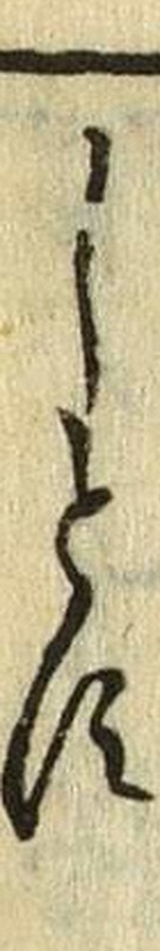しとす
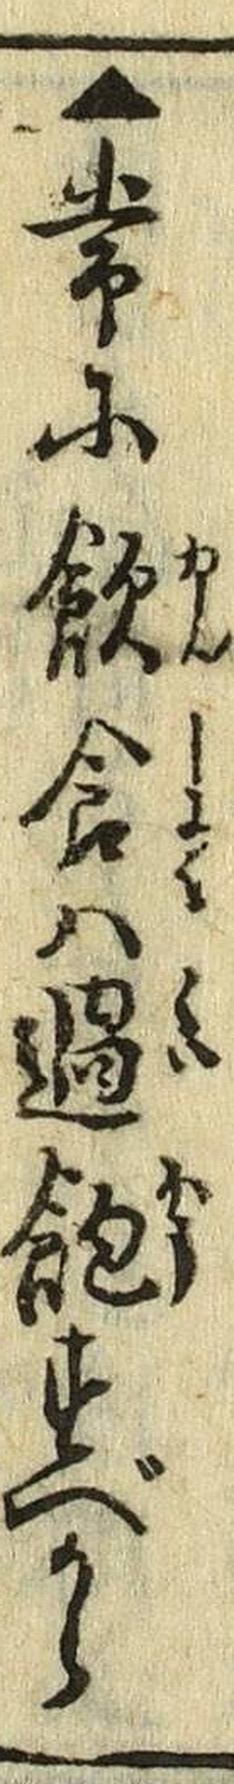▲常に飲食は過飽すべから
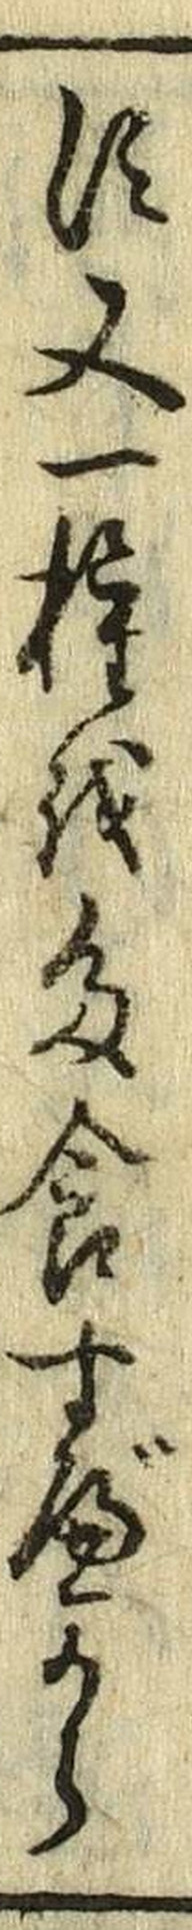す又一種を多食すべから
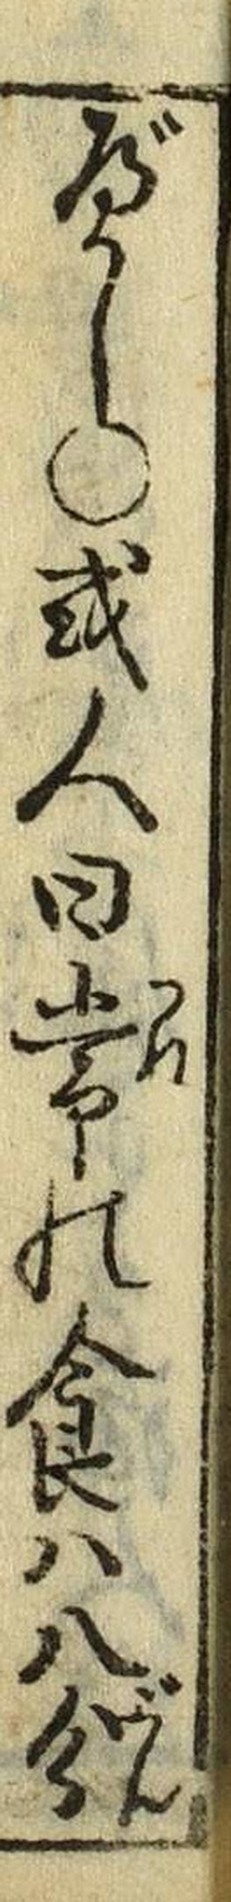べし○或人曰常の食は八分
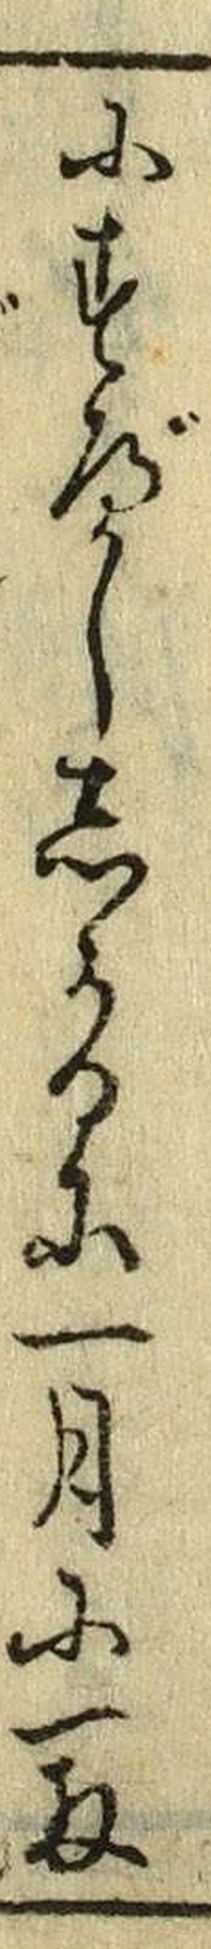にすべししかるに一月に一両
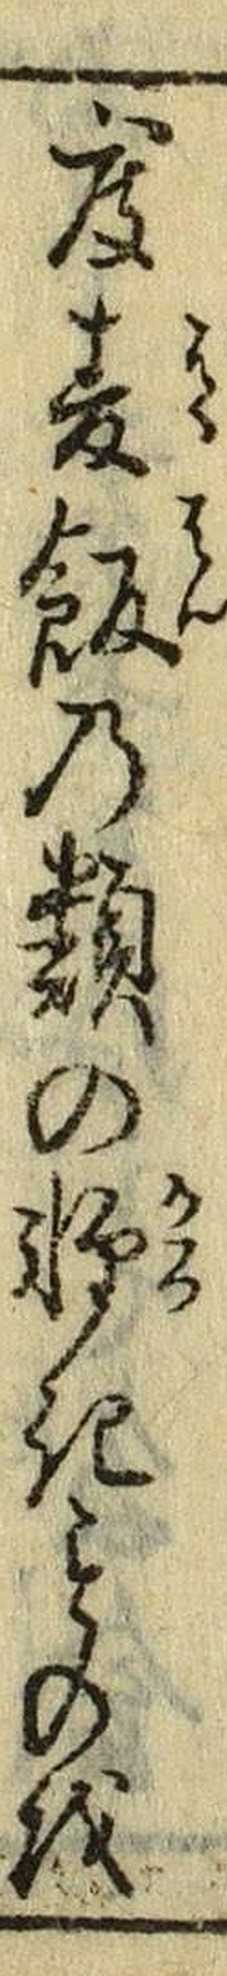度麦飯の類の軽きものを
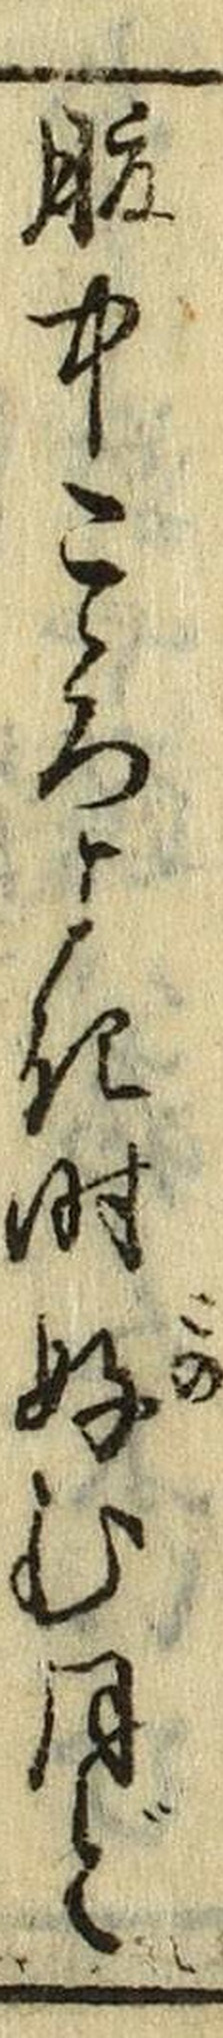腹中こゝろよき時好むほど
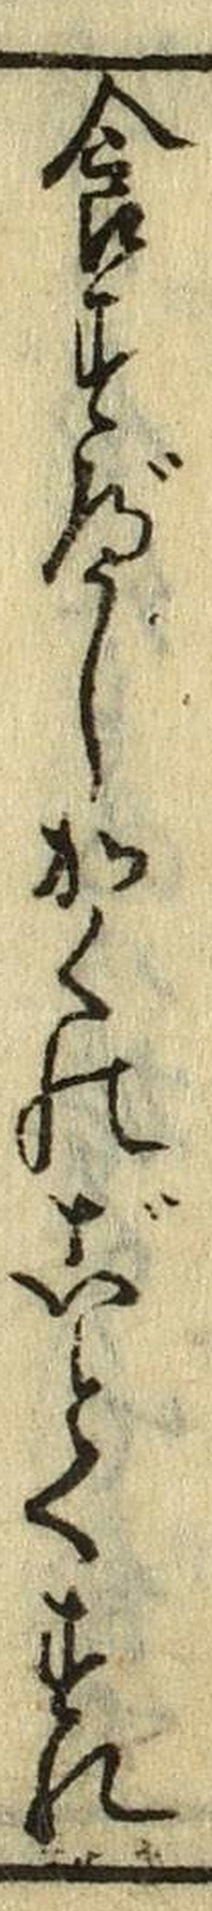食すべしかくのごとくすれ
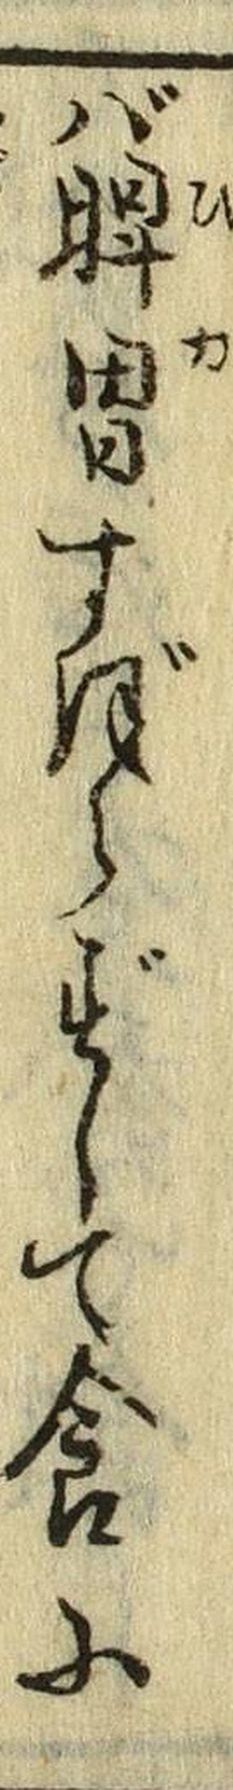ば脾胃すぼらずして食に
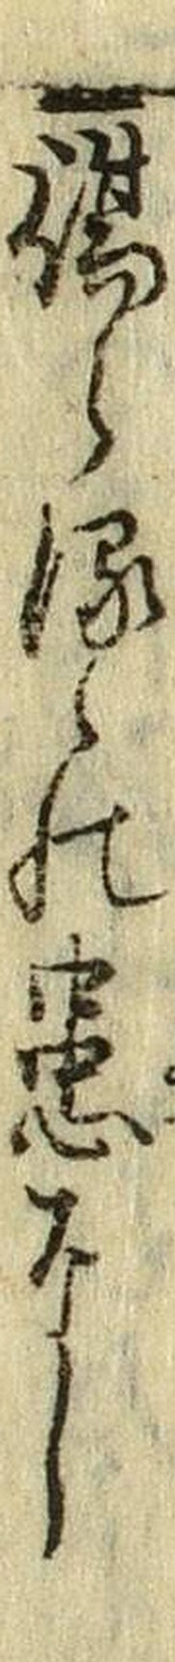傷らるゝの患なし
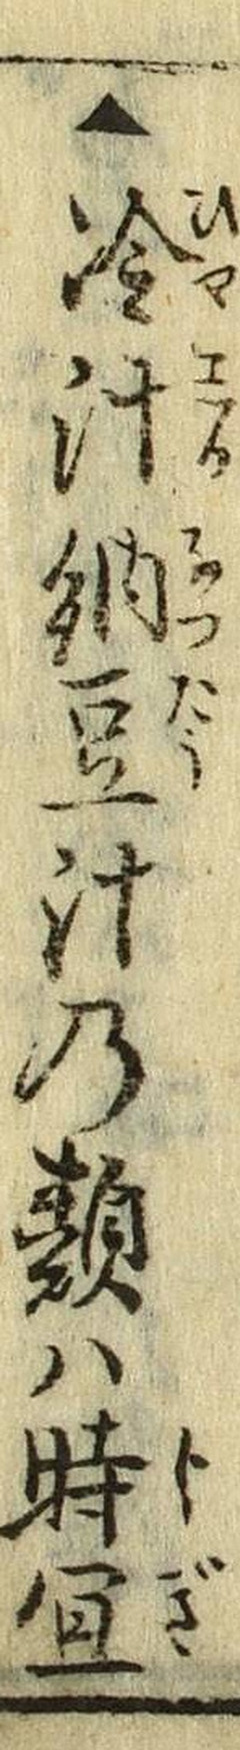▲冷汁納豆汁の類は時宜
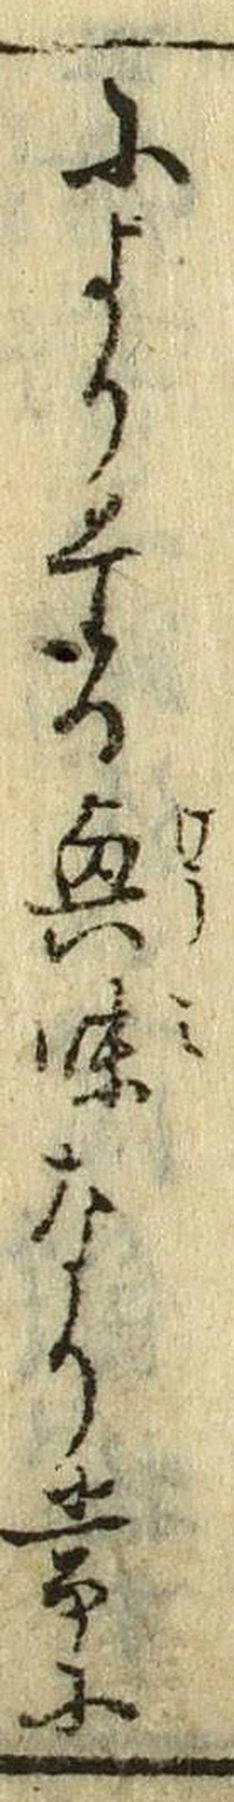によりたる興味なり常に
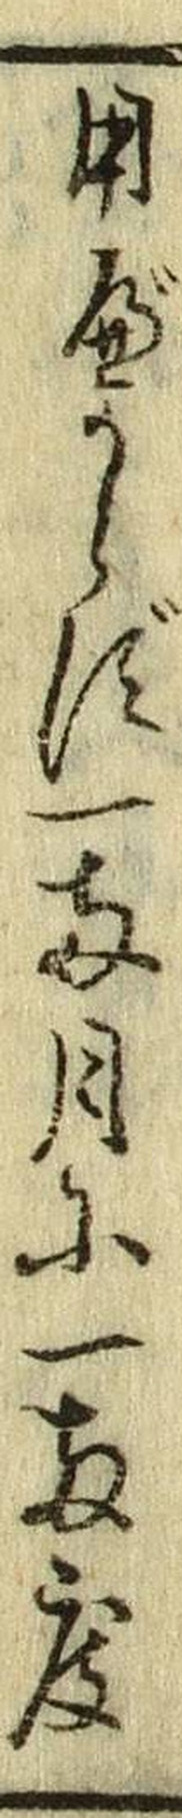用べからず一両月に一両度
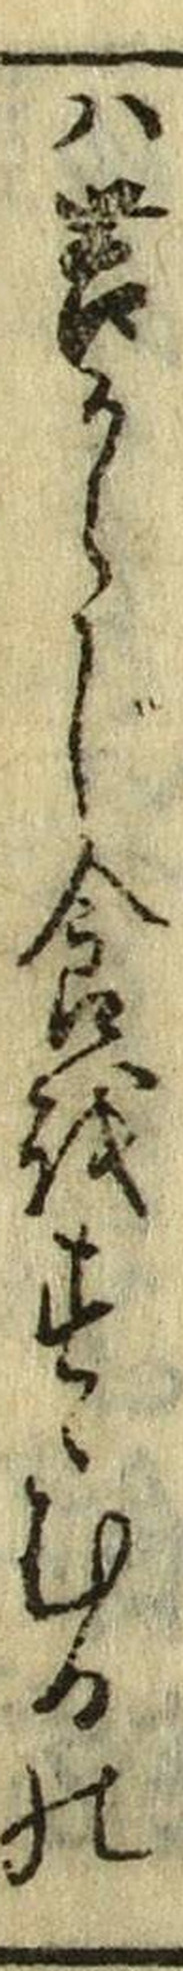は苦からじ食をすゝむるの

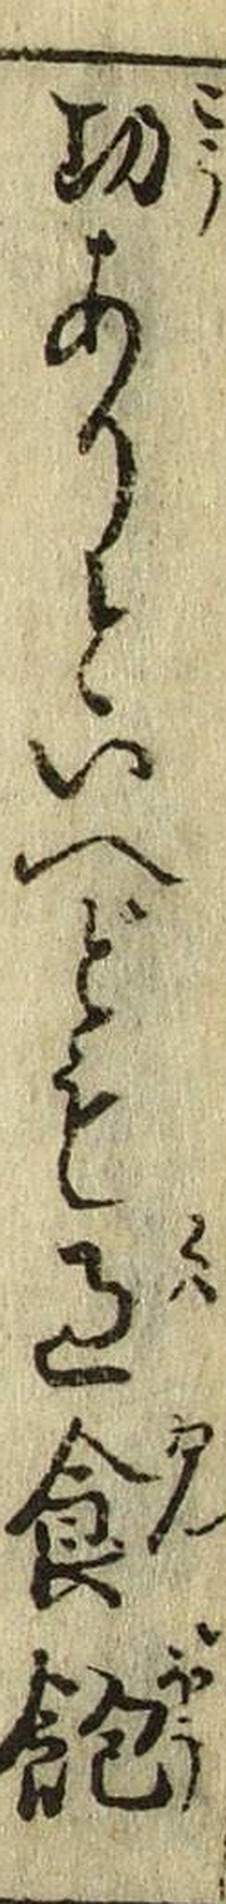功ありといへども過飲飽
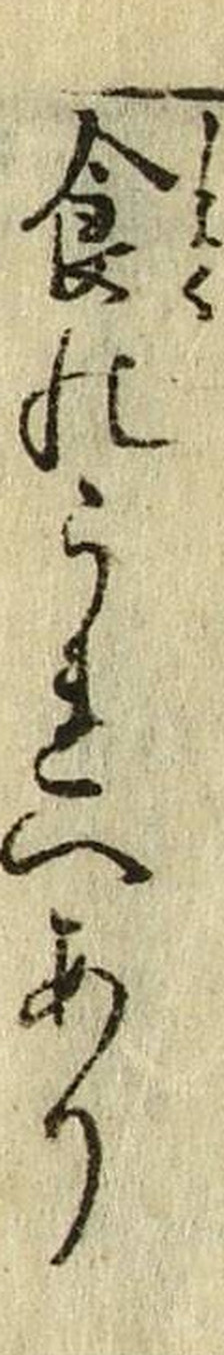食のうれへあり
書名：居家養生記
